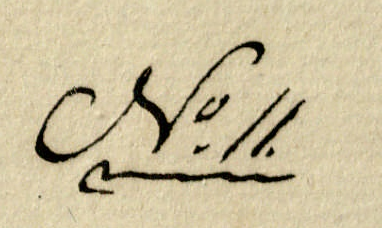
No 11.
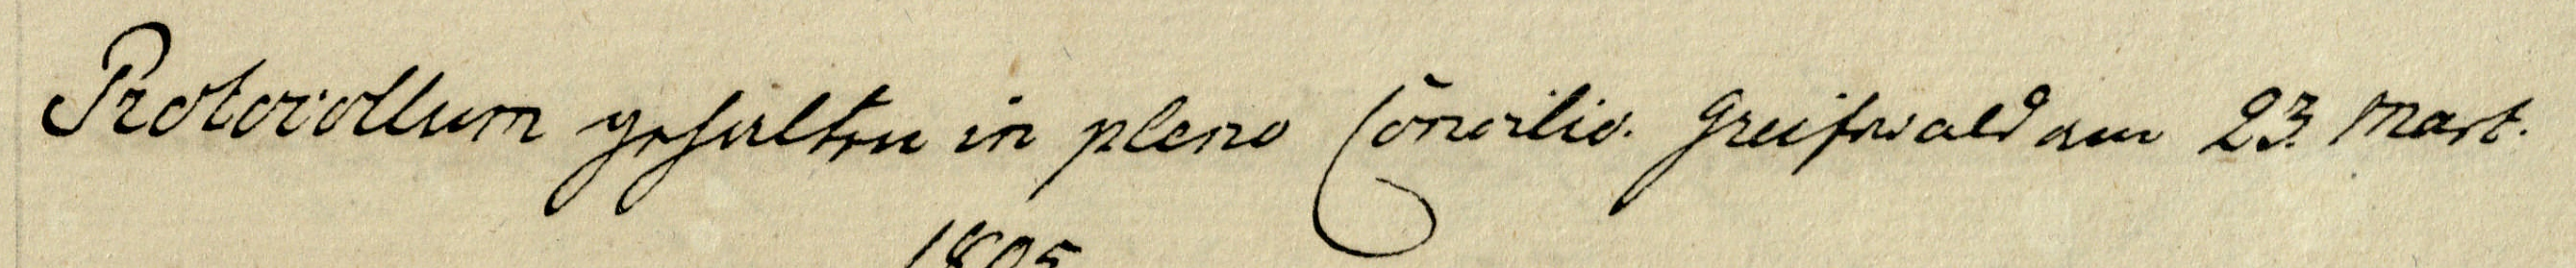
Protocollum gehalten in pleno Concilio. Greifswald am 23 Mart.
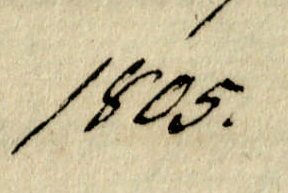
1805
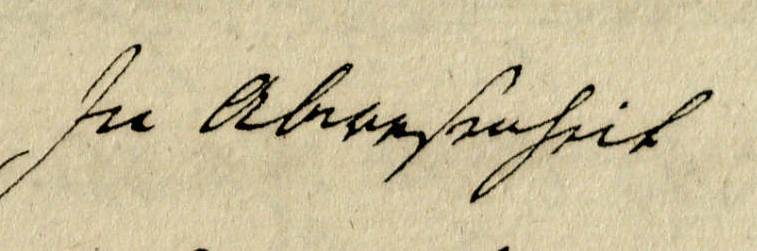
In Abwesenheit
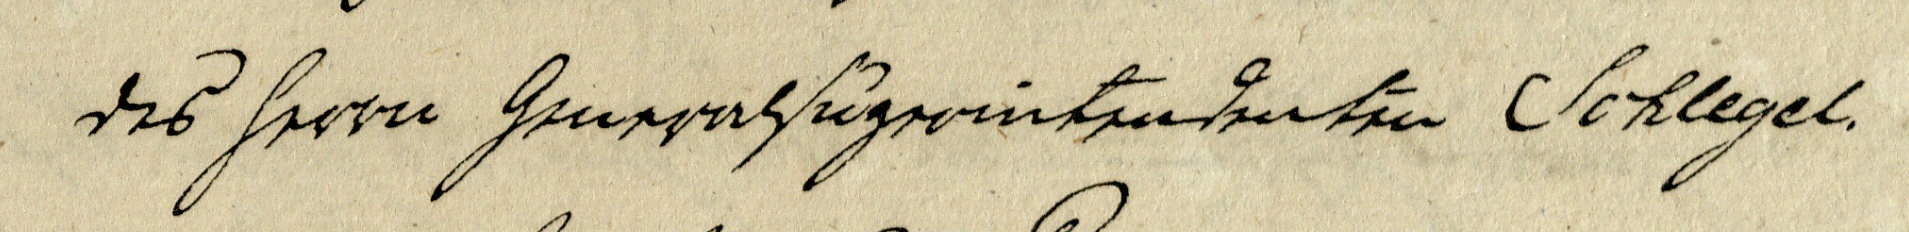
des Herrn Generalsuperintendenten Schlegel.
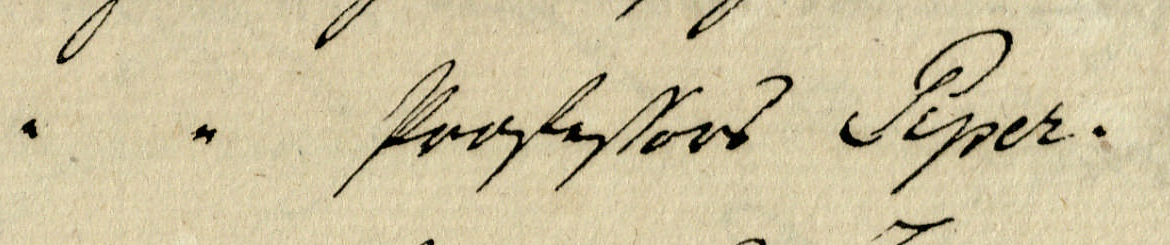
Professors Piper.
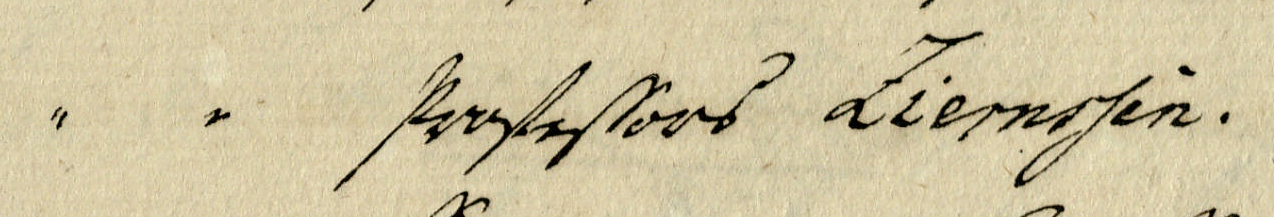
Professors Ziemssen.
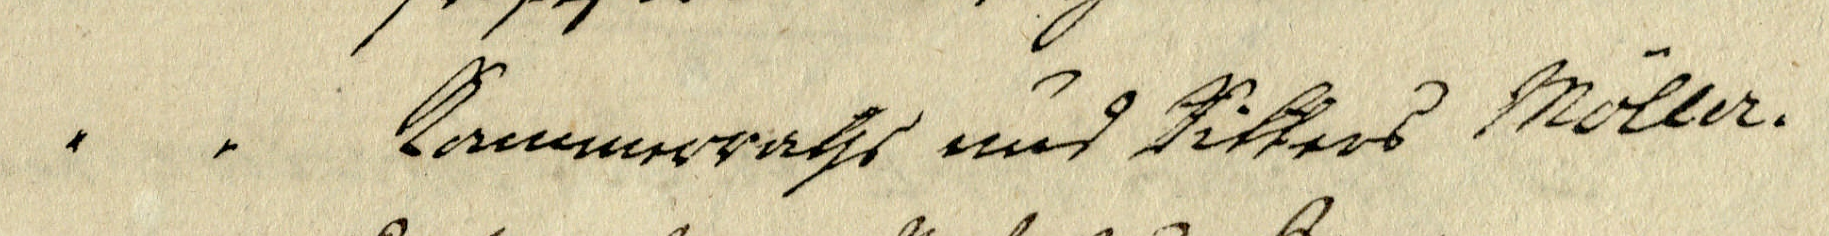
Kammerraths und Ritters Möller.
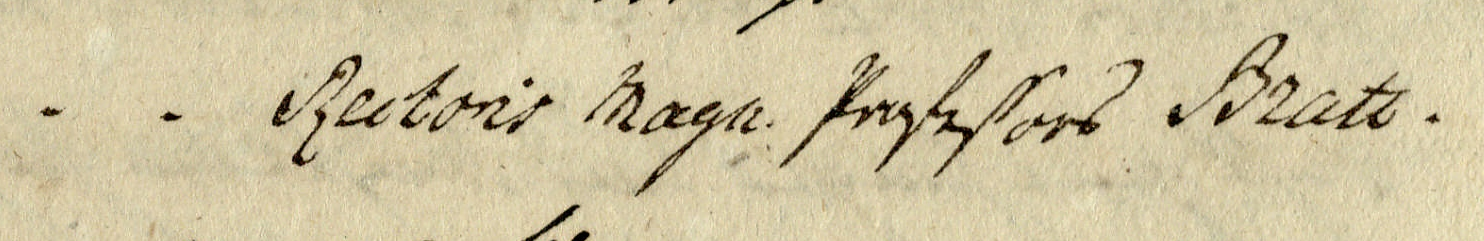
Rectoris Magn. Professors Bratt.
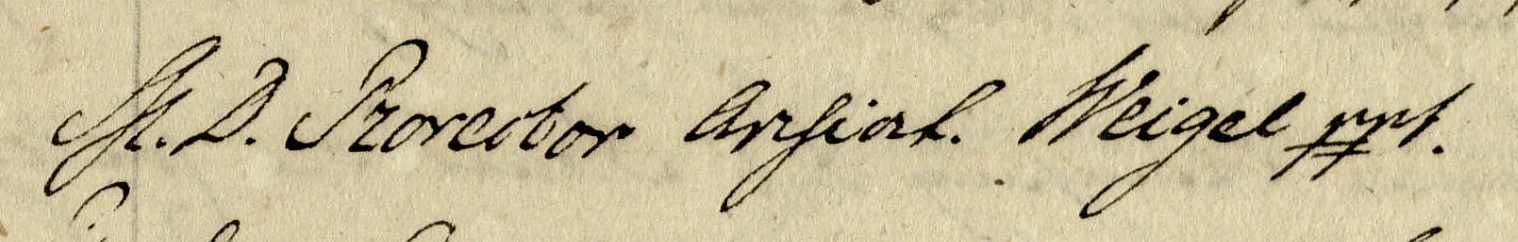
M. D. Prorector Archiat. Weigel ppt.
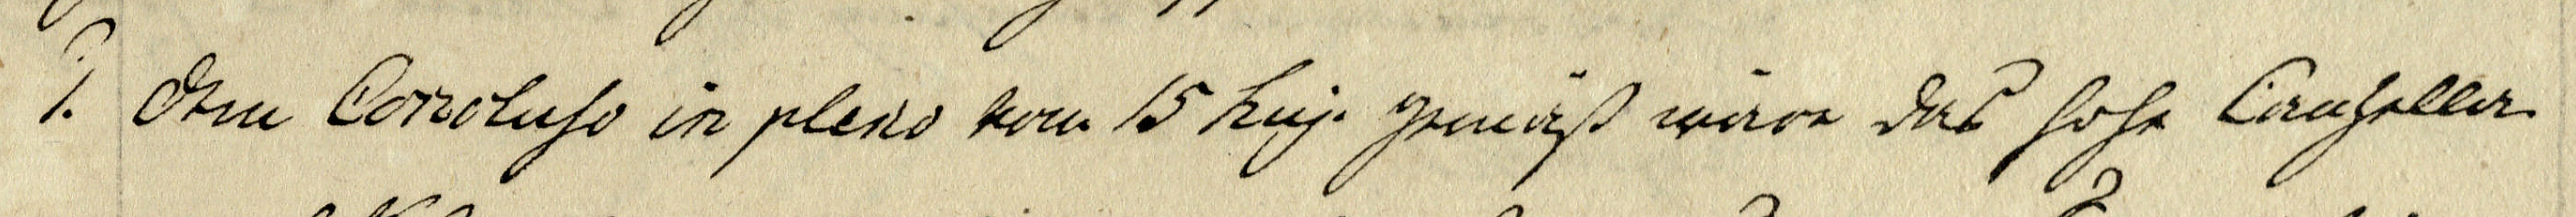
1. Dem Concluso in pleno vom 15 huj. gemäß wäre das hohe Canzella¬
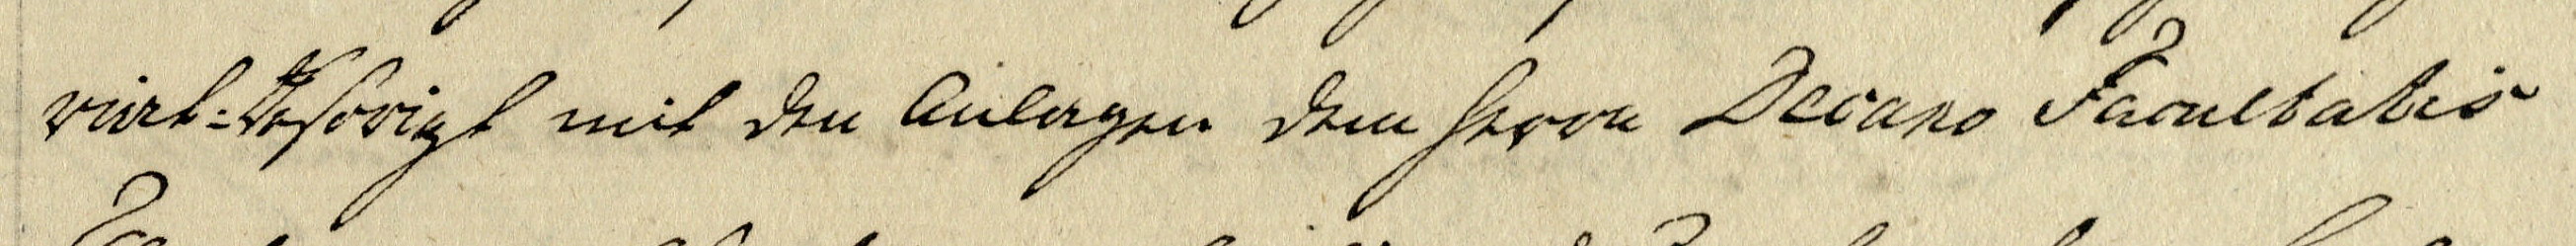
riat-Rescript mit den Anlagen dem Herrn Decano Facultatis
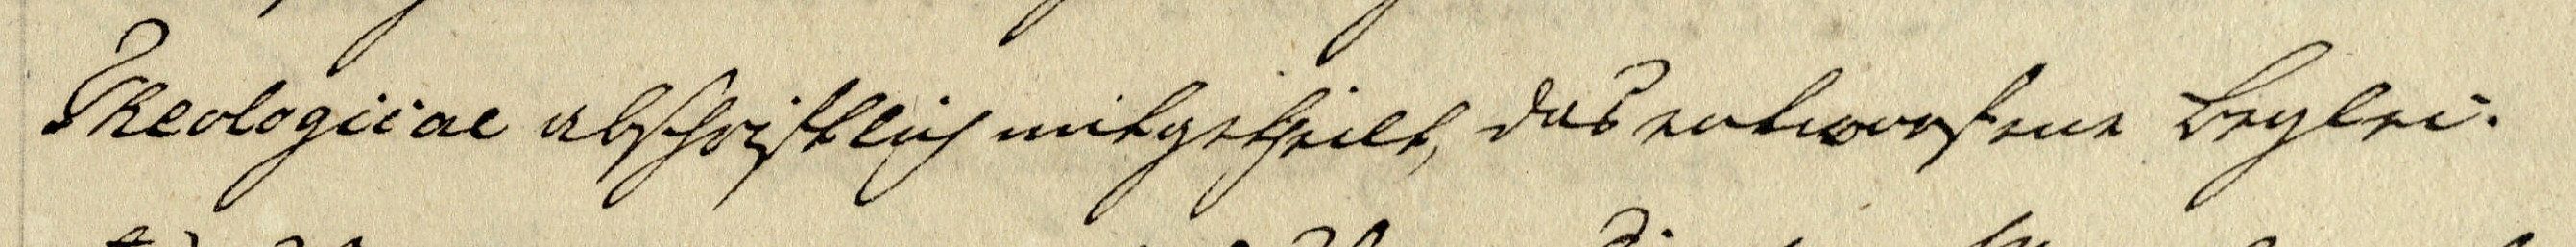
Theologicae abschriftlich mitgetheilt, das entworfene Beglei¬
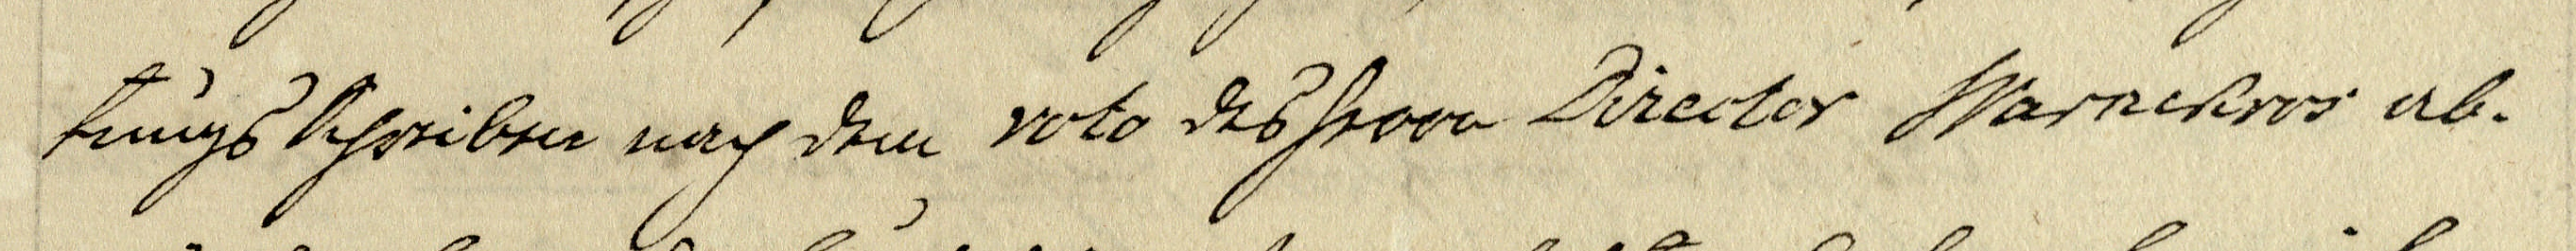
tungs Schreiben nach dem voto des Herrn Director Warnekros ab¬
